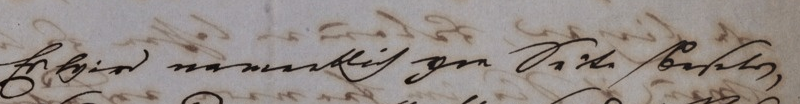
Es wird namentlich von Seite Basels,
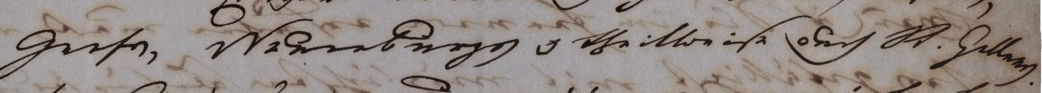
Genfs, Neuenburgs & theilweise auch St. Gallens
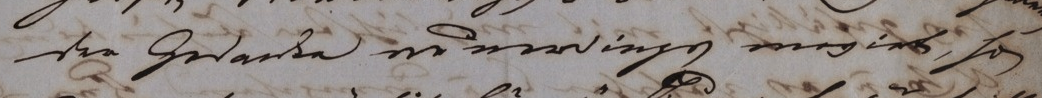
der Gedanke neuerdings movirt, so
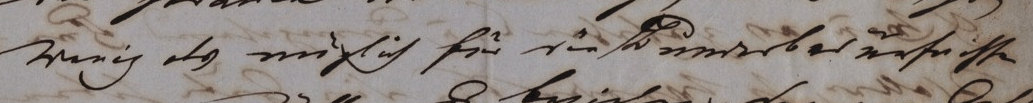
wenig als möglich für die Bundesbedürfnisse
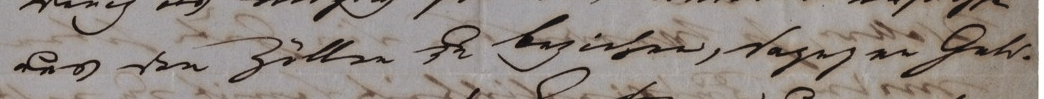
aus den Zöllen zu beziehen, dagegen Geld-
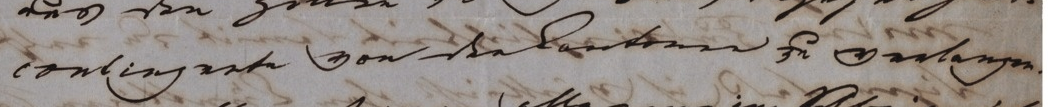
contingente von den Cantonen zu verlangen.
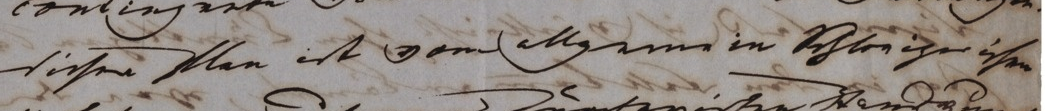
Dieser Plan ist vom allgemein Schweizerischen
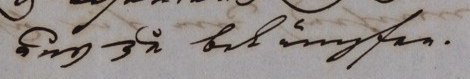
aus zu bekämpfen.
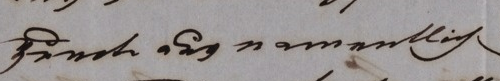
puncte aus namentlich
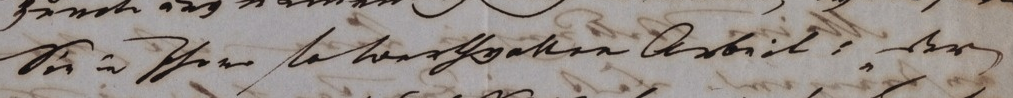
Sie in Ihrer so werthvollen Arbeit: «Der
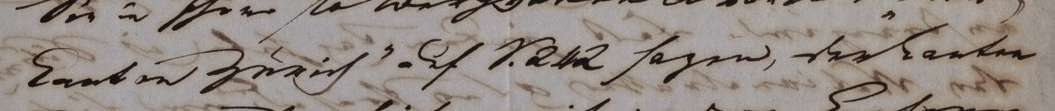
Canton Zürich» auf S. 242 sagen, der Canton
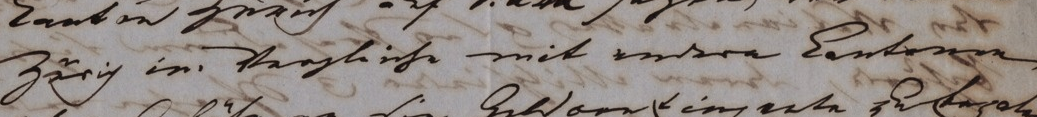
Zürich im Vergleiche mit andern Cantonen
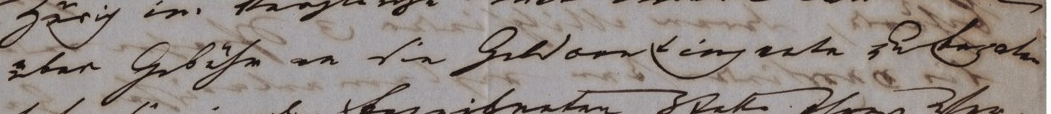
über Gebühr an die Geldcontingente zu bezalen
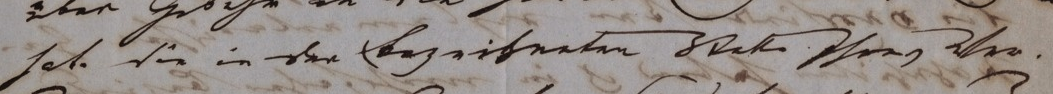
hat. Die in der bezeichneten Stelle Ihres Wer-
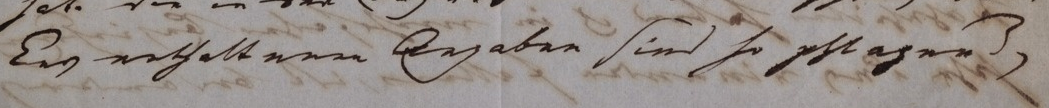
kes enthaltenen Angaben sind so schlagend,
